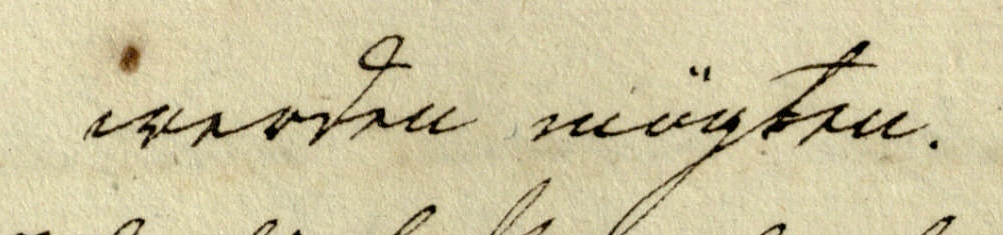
werden mögten.
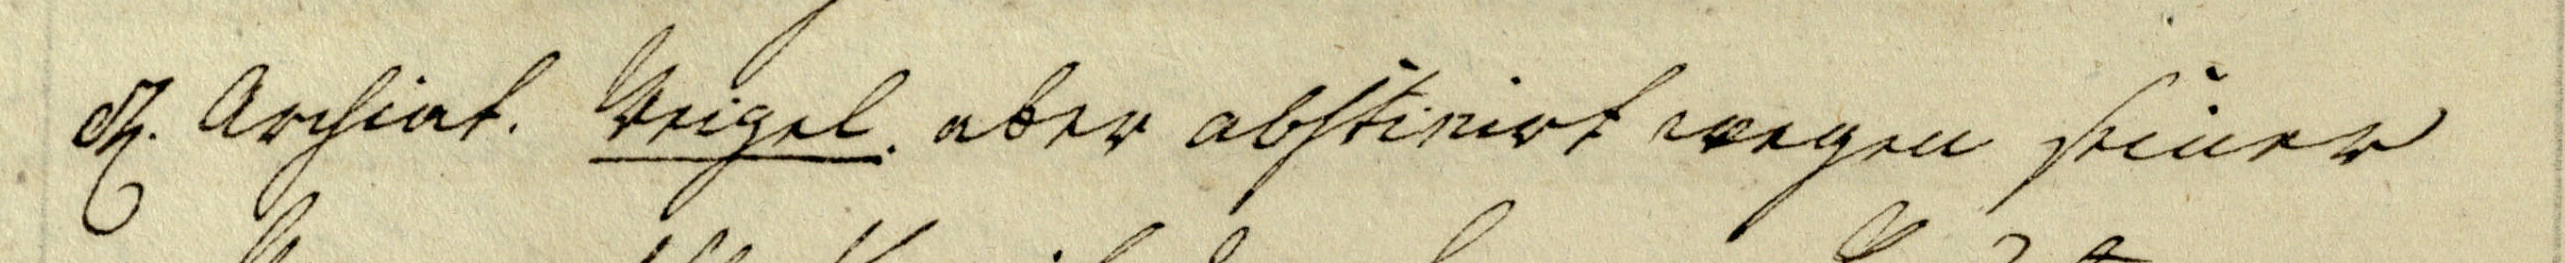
dh. Archiat. Weigel, aber abstinirt wegen seiner
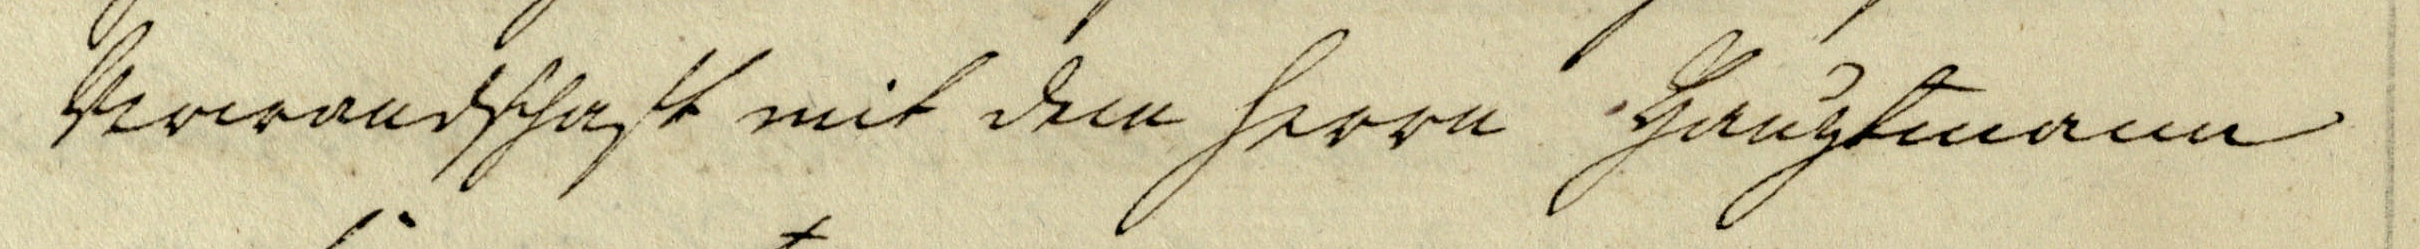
Verwandschaft mit dem Herrn Hauptmann
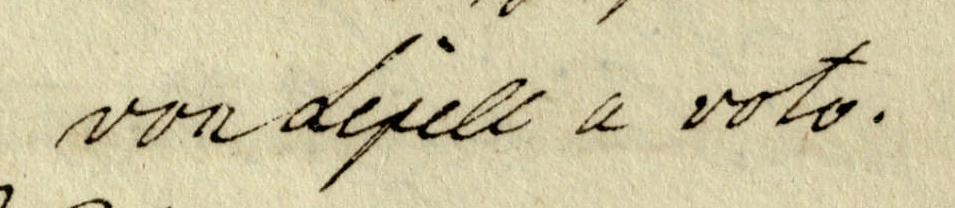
von Lepell a voto.
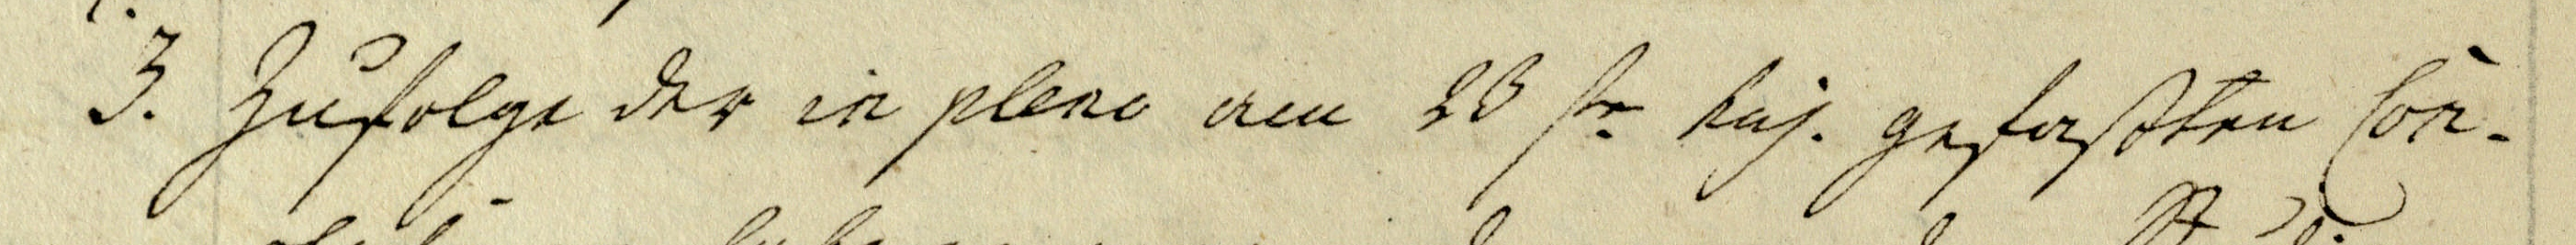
3. Zufolge der in pleno am 23 ste huj. gefaßten Con¬
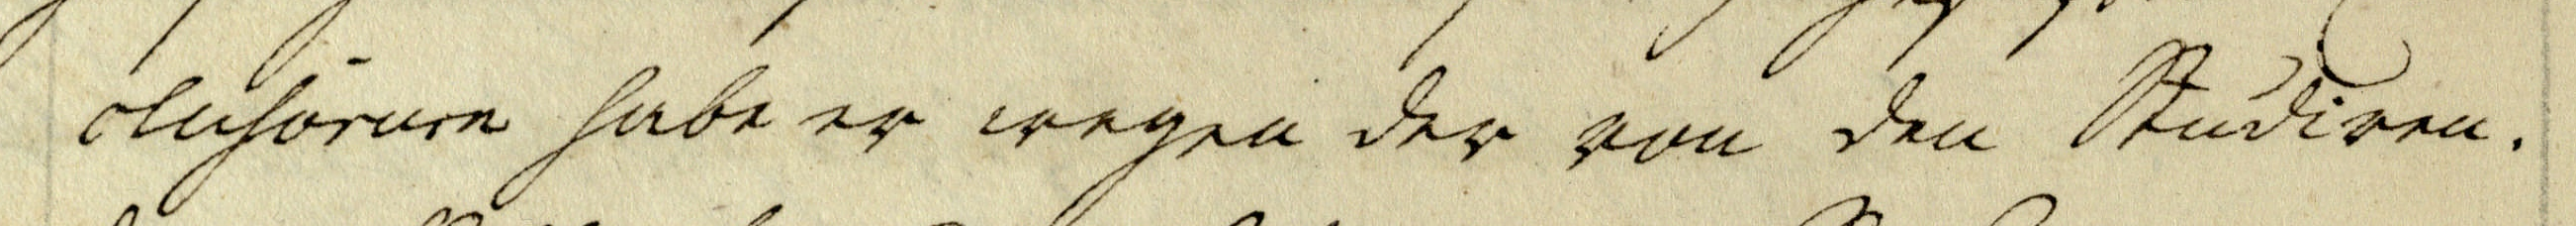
clusorum habe er wegen der von den Studiren¬
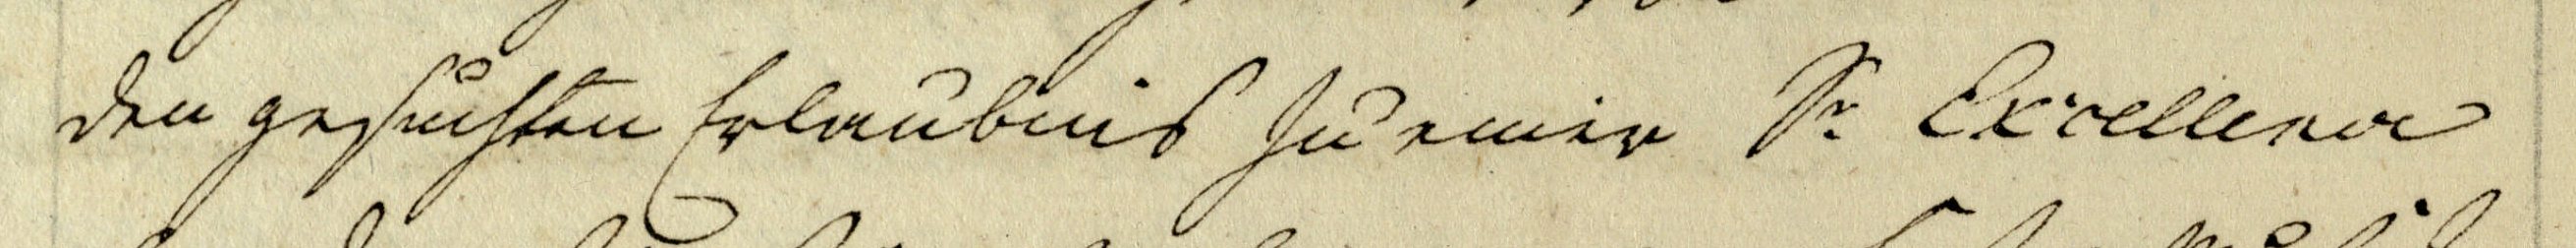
den gesuchten Erlaubnis zu einer Sr Excellence
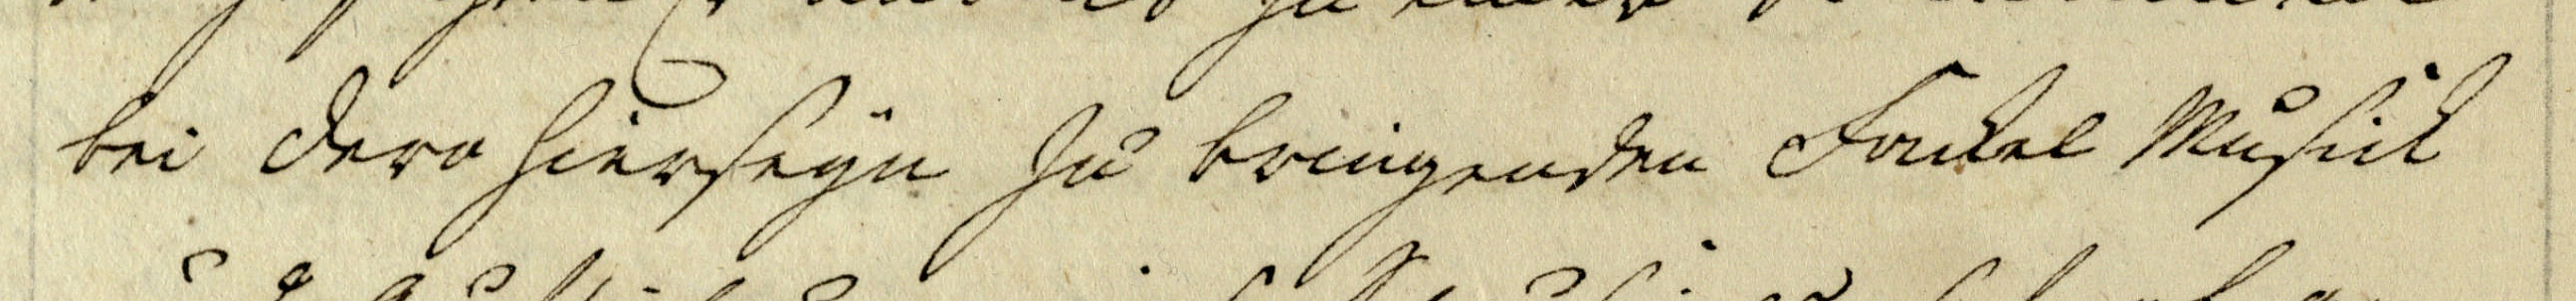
bei dero Hierseÿn zu bringenden Fackel Musick
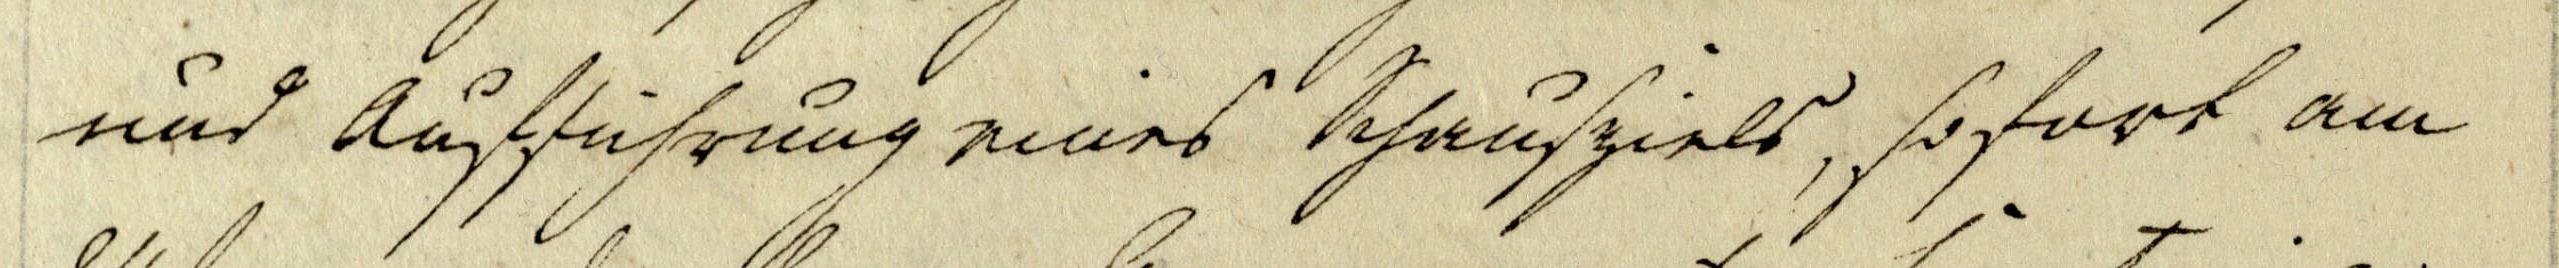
und Aufführung eines Schauspiels, sofort am
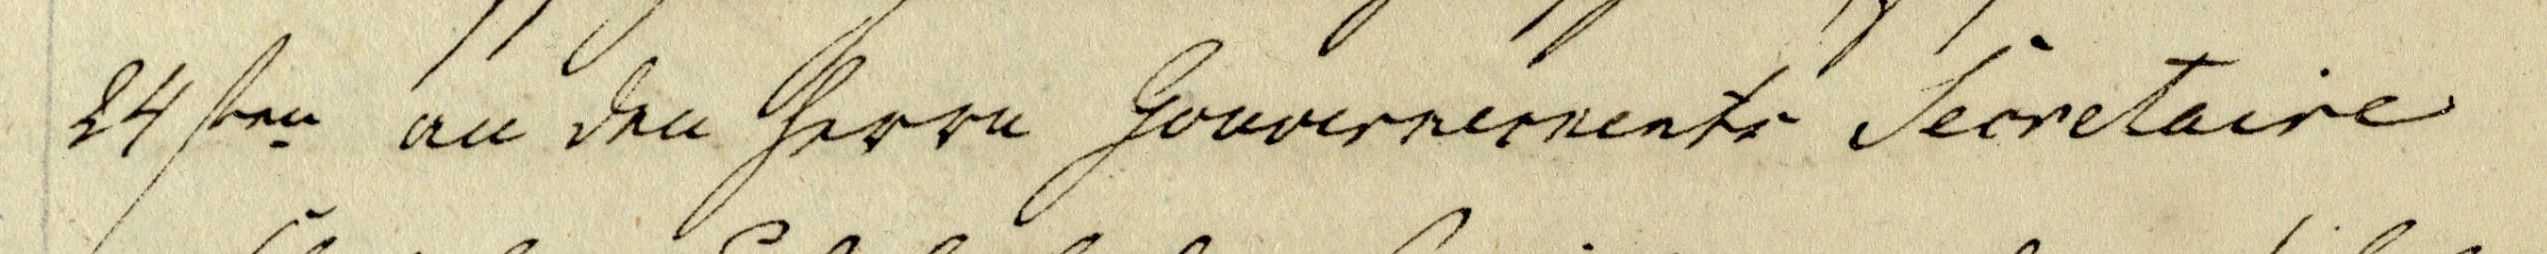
24 sten an den Herrn Gouvernements Secretaire
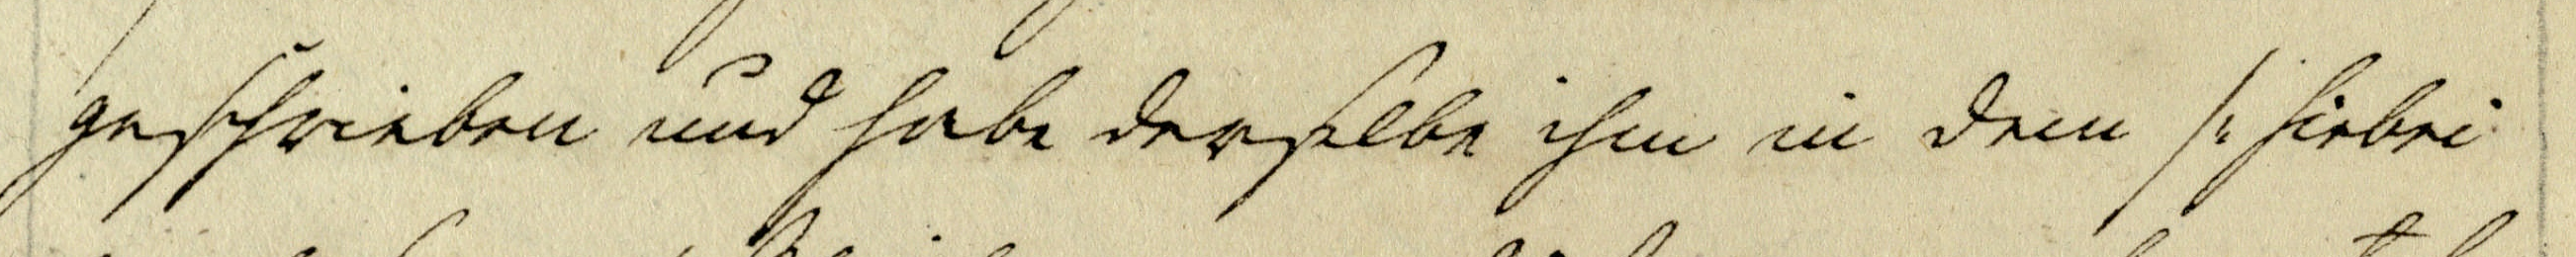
geschrieben und habe derselbe ihm in dem /: hiebei
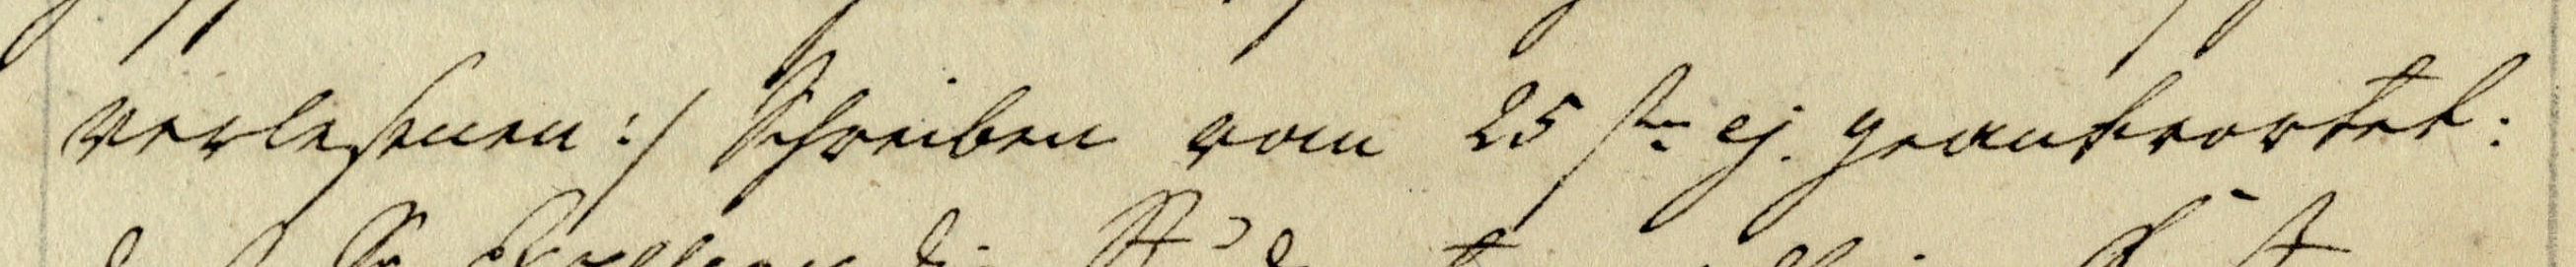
verlesenen :/ Schreiben vom 25 sten ej. geantwortet:
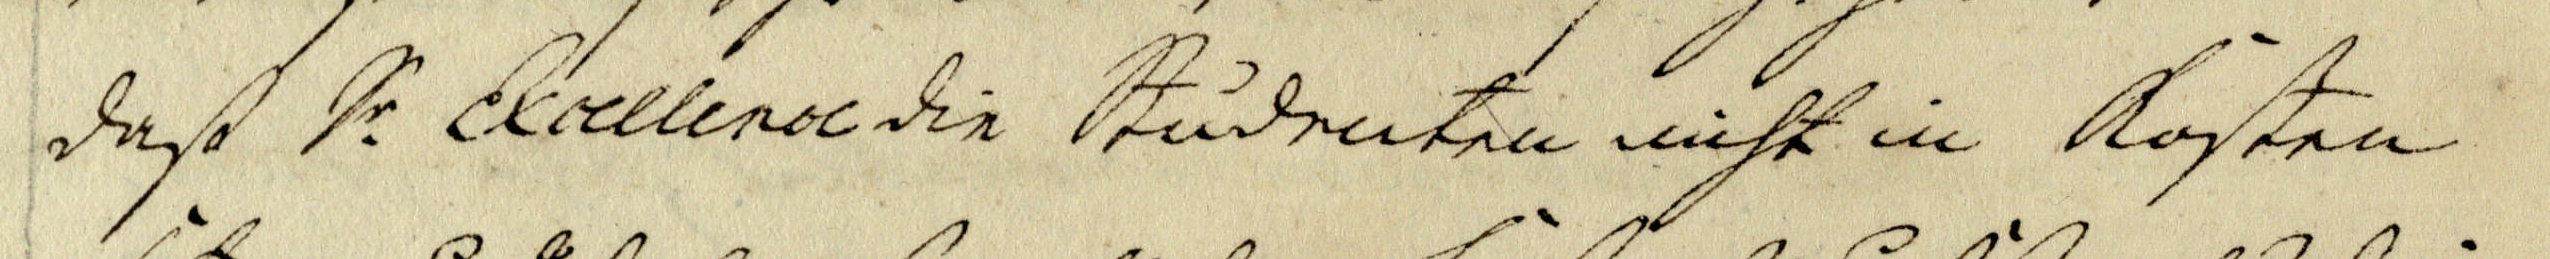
daß Sr Excellence die Studenten nicht in Kosten
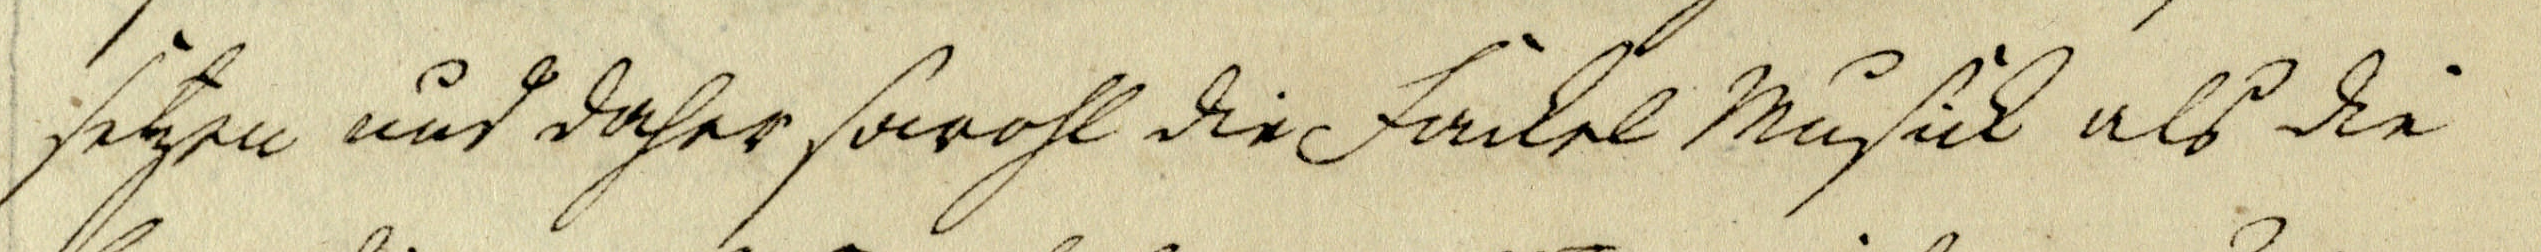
setzen und daher sowohl die Fackel Musick als die
